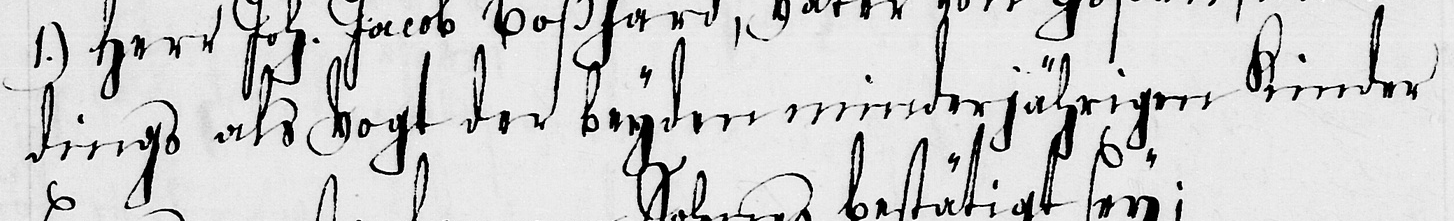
dings als Vogt der Beyden minderjährigen Kinder
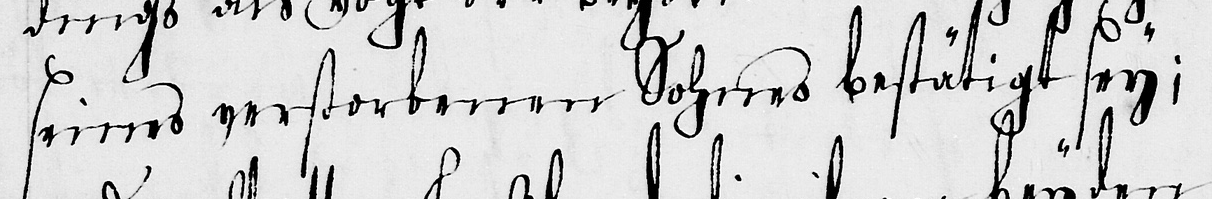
seines verstorbenen Sohnes bestätigt sey;
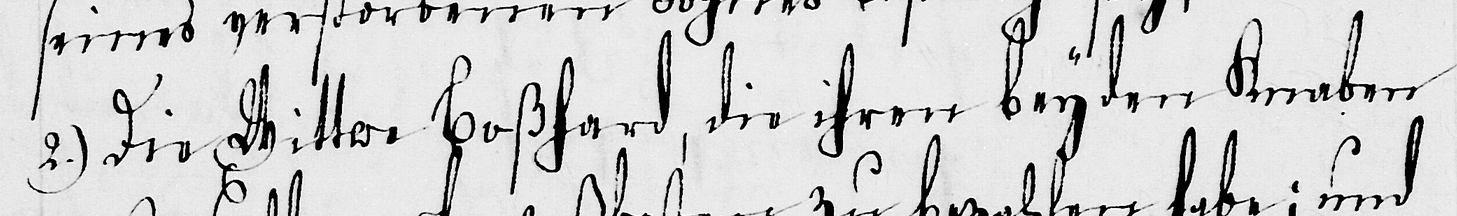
2.) Die Wittwe Boßhard, die ihren beyden Knaben
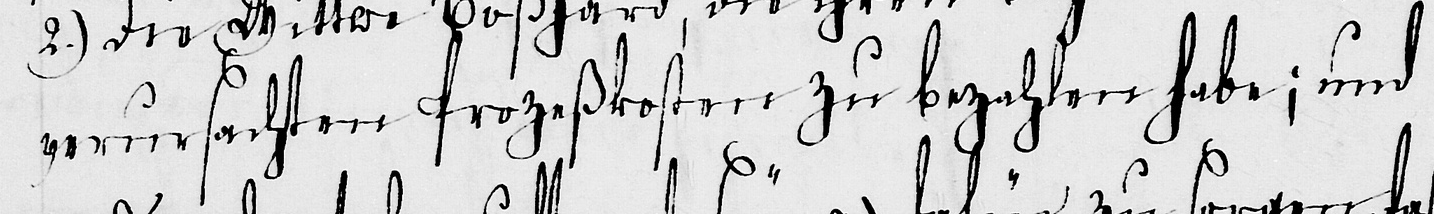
verursachten Prozeßkosten zu bezahlen habe; und
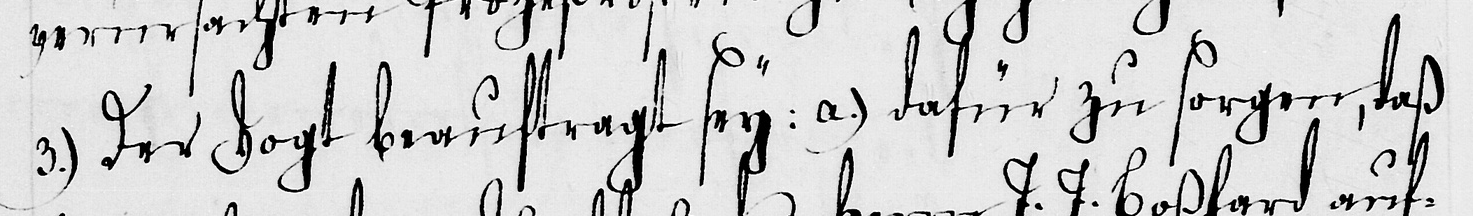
3.) Der Vogt beauftragt sey: a.) dafür zu sorgen, daß
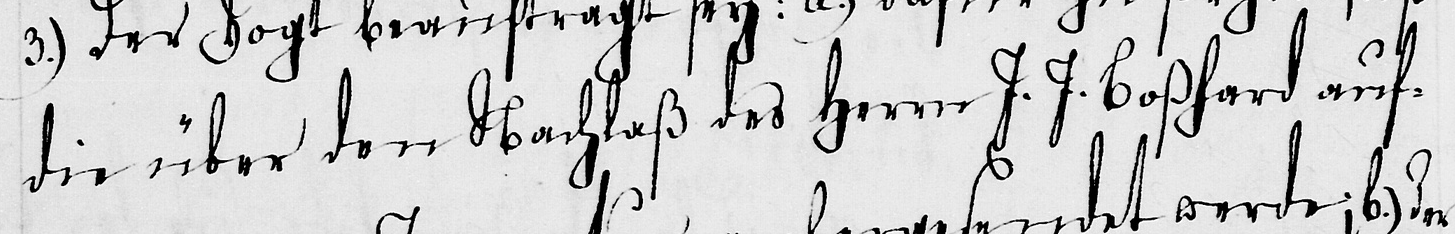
die über den Nachlaß des Herrn J. J. Boßhard auf¬
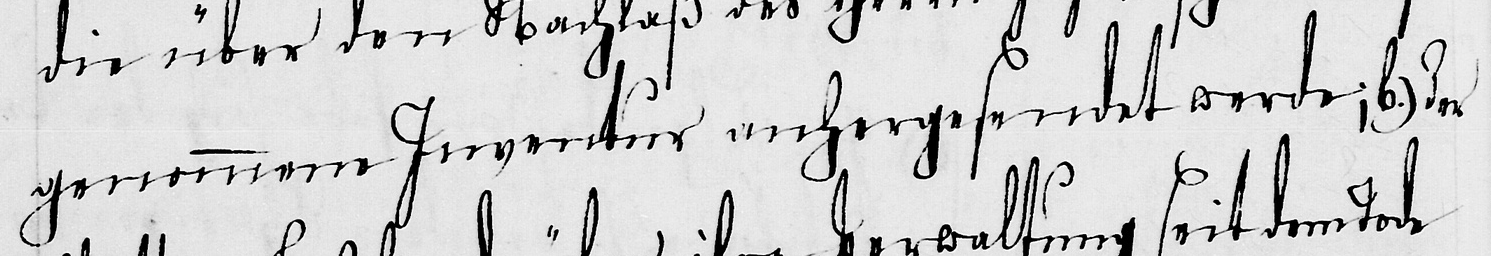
genommene Inventur anhergesendet werde; b.) der
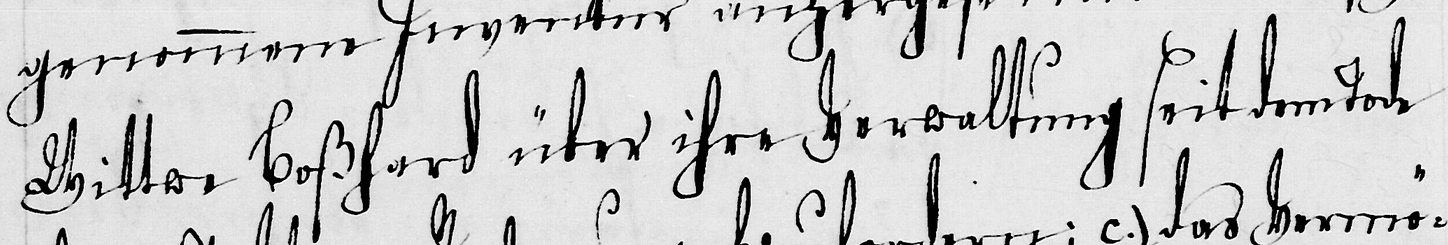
Wittwe Boßhard über ihre Verwaltung seit dem Tode
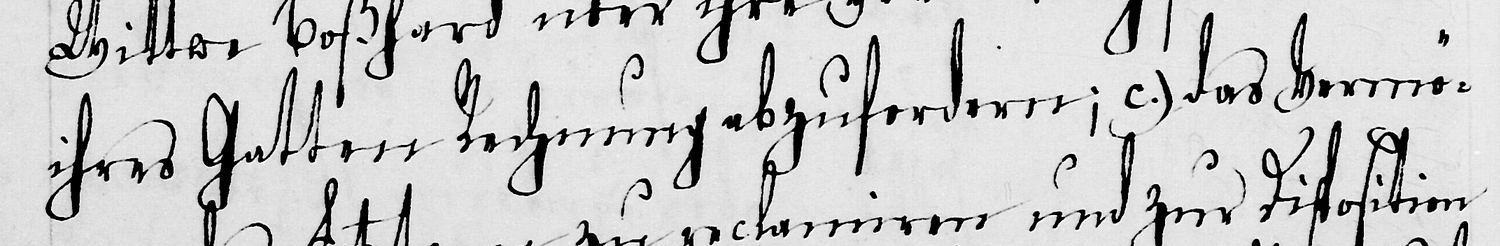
ihres Gatten Rechnung abzufordern; c.) das Vermö¬
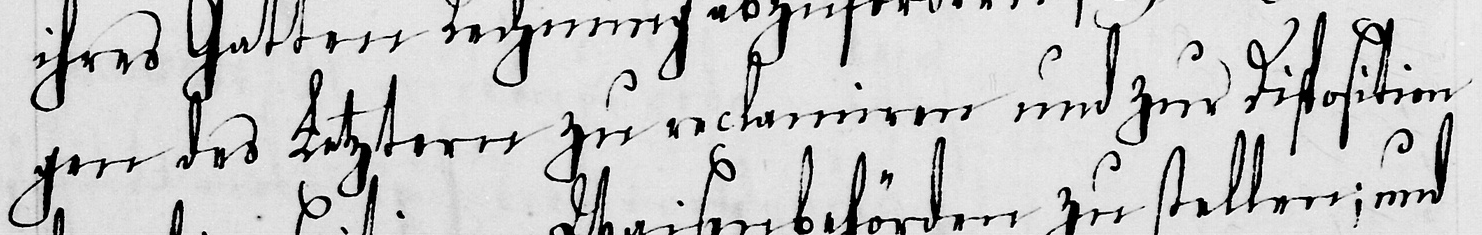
gen des Letztern zu reclamiren und zur Disposition
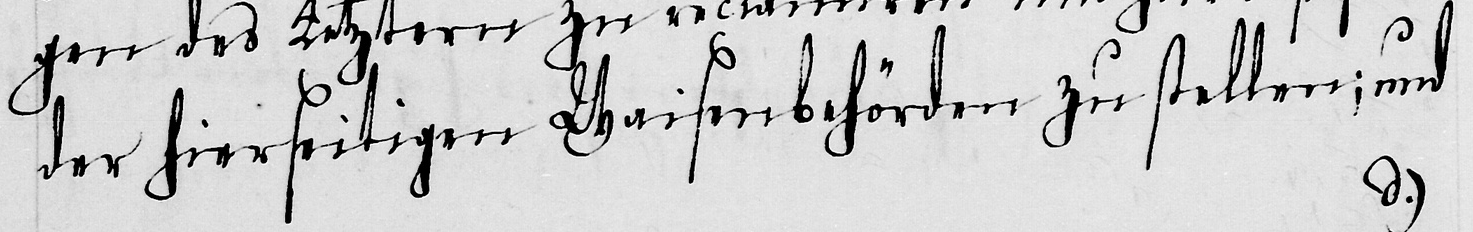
der hierseitigen Waisenbehörden zu stellen; und
